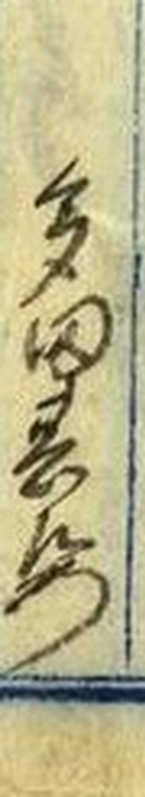多田甚左衛

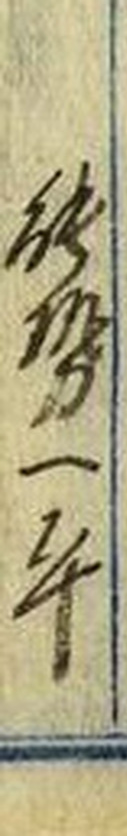能勢一平
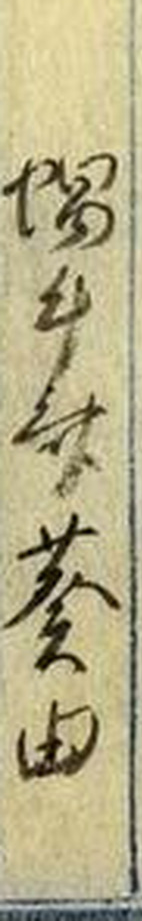蝸牛斎葵由
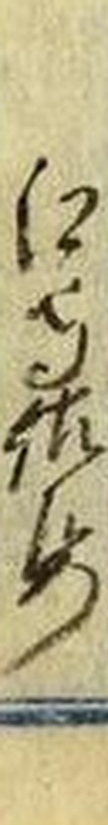江守佐左衛門
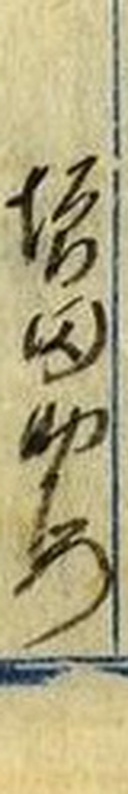増田助右衛門
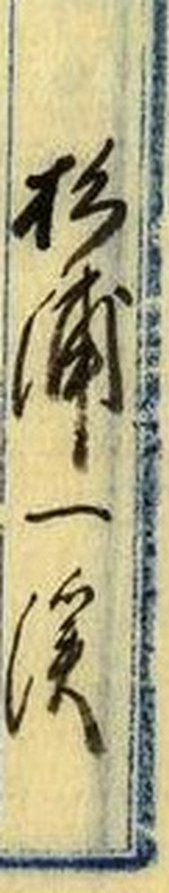松浦一渓
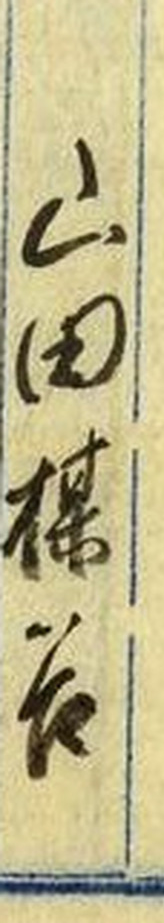山田楳谷

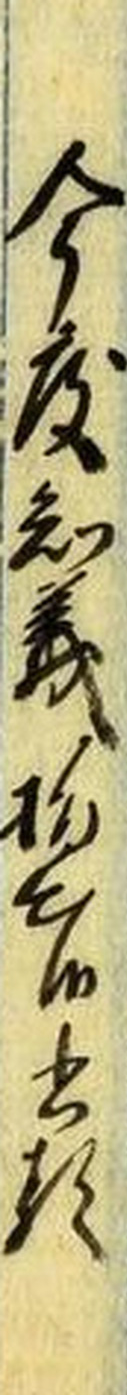今度知義指出候書類
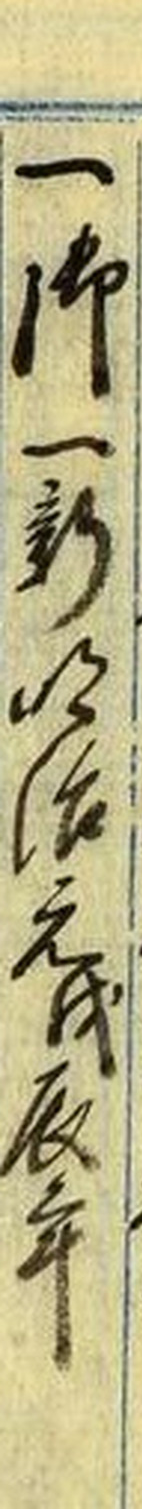一御一新明治元戊辰年
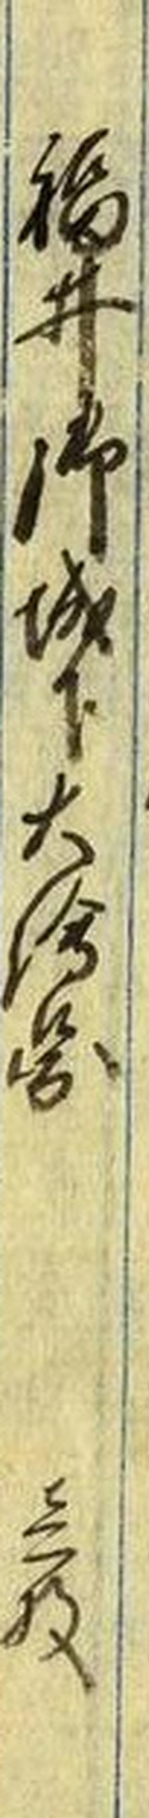福井御城下大絵図壱枚
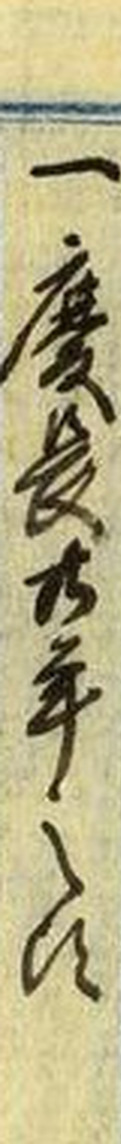一慶長廿年之頃
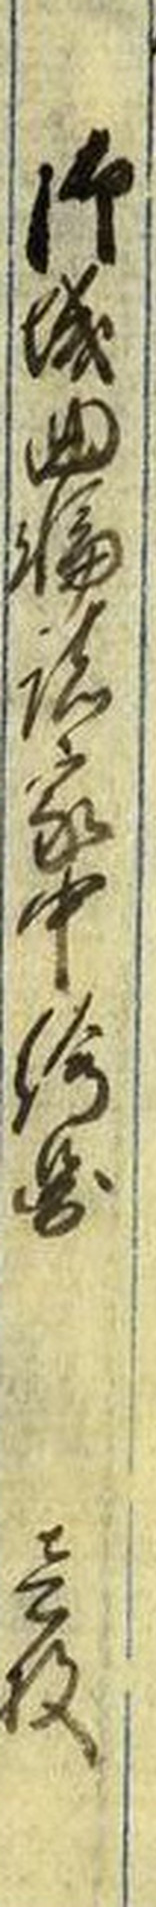御城曲輪諸家中絵図壱枚
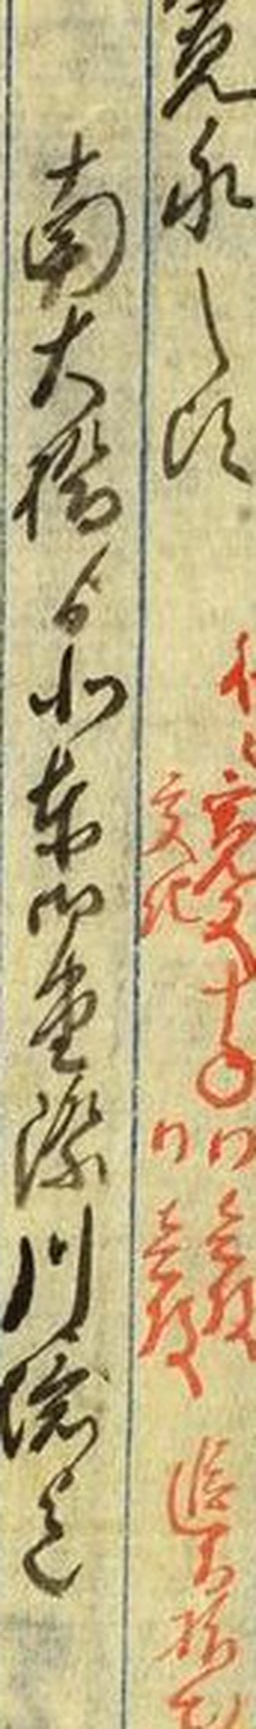南大橋よりゟ北東御堂際川境迄
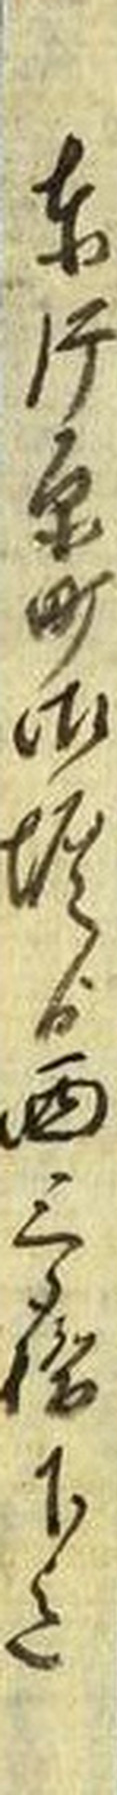東片原町御堀ゟ西三つ橋下迄
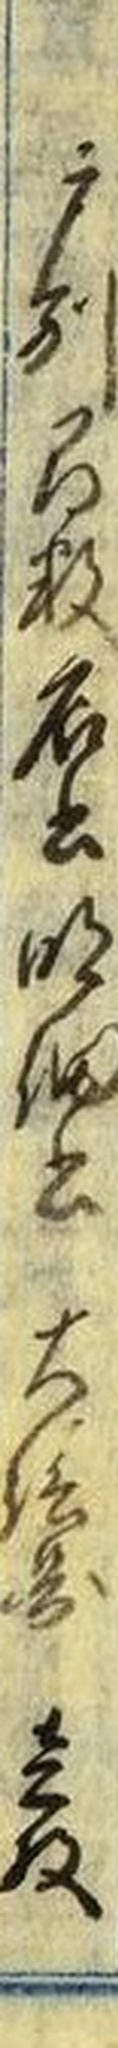戸別間数名書明細書大絵図壱枚
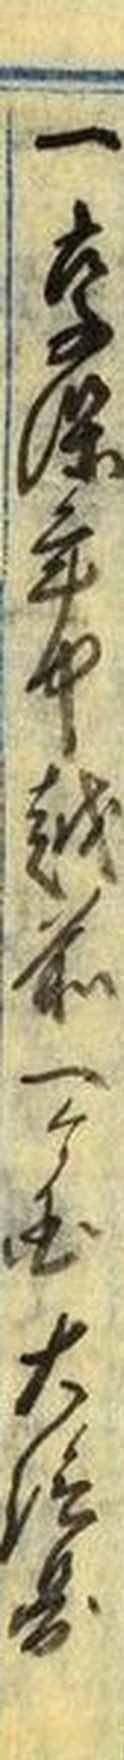一享保年中越前一ヶ国大絵図壱枚
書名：温古集 四巻
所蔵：福井県文書館 Fukui Prefectural Archives
